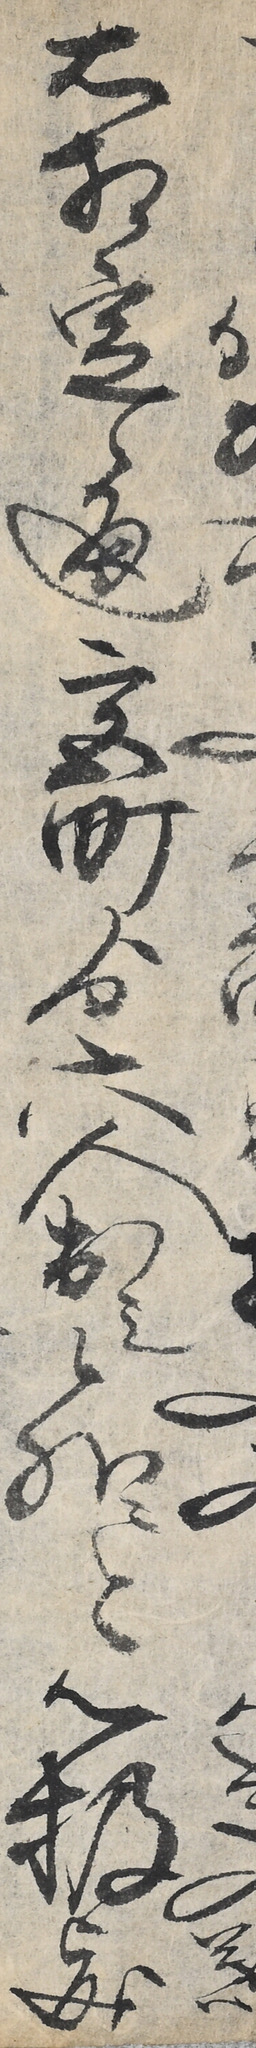右相定之通宮町ゟ六人出シ候様ニと御扱被成
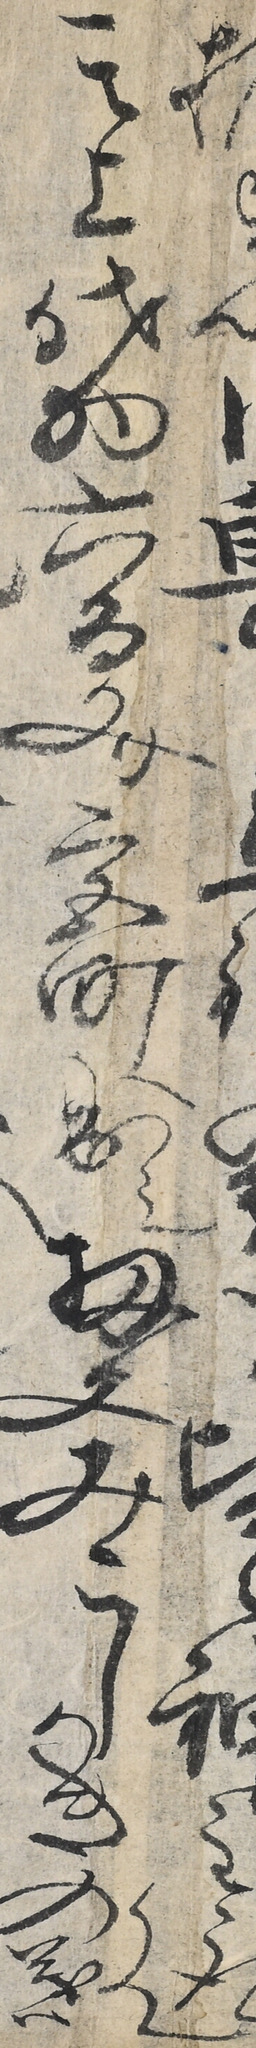其上代物六百文宮町へ出シ扨又みこしかきの義ハ
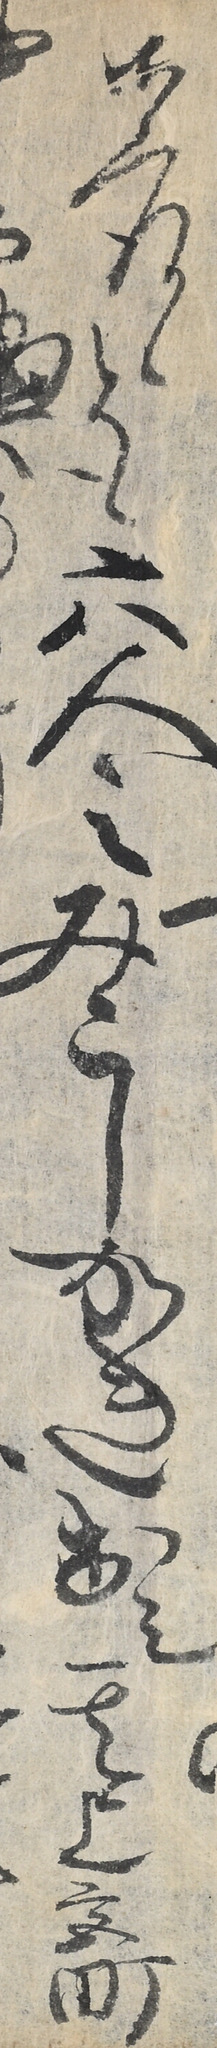御座候とも六人之みこしかき出シ其上宮町
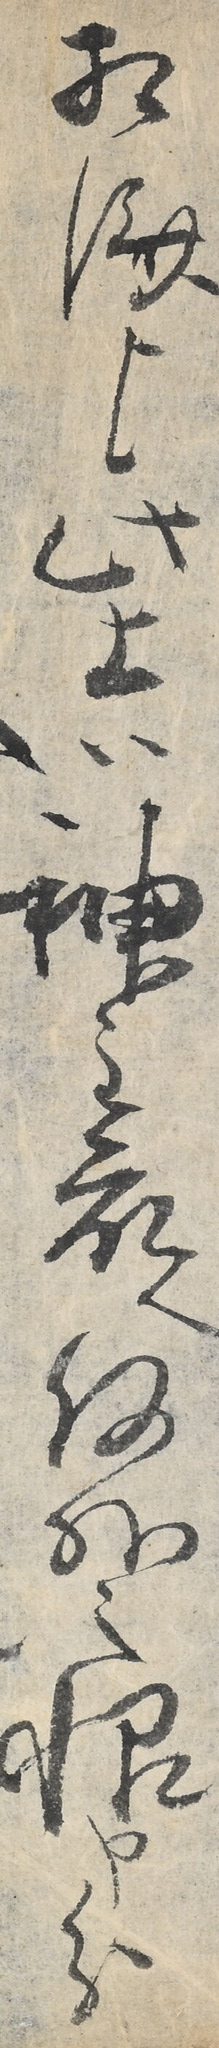相済申候此上ハ神主衆へ何様之恨申分
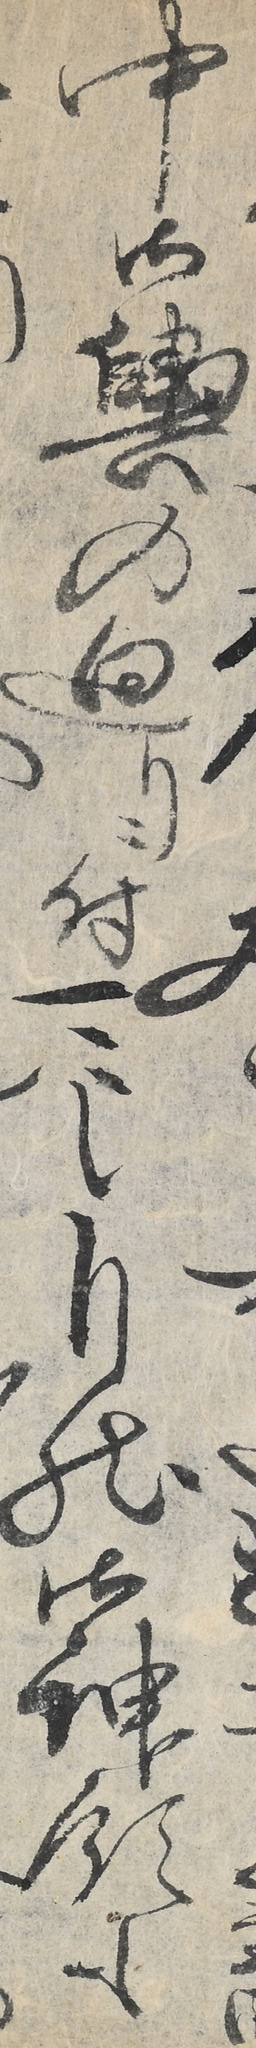中御輿の廻りニ付可申候自然御神領も
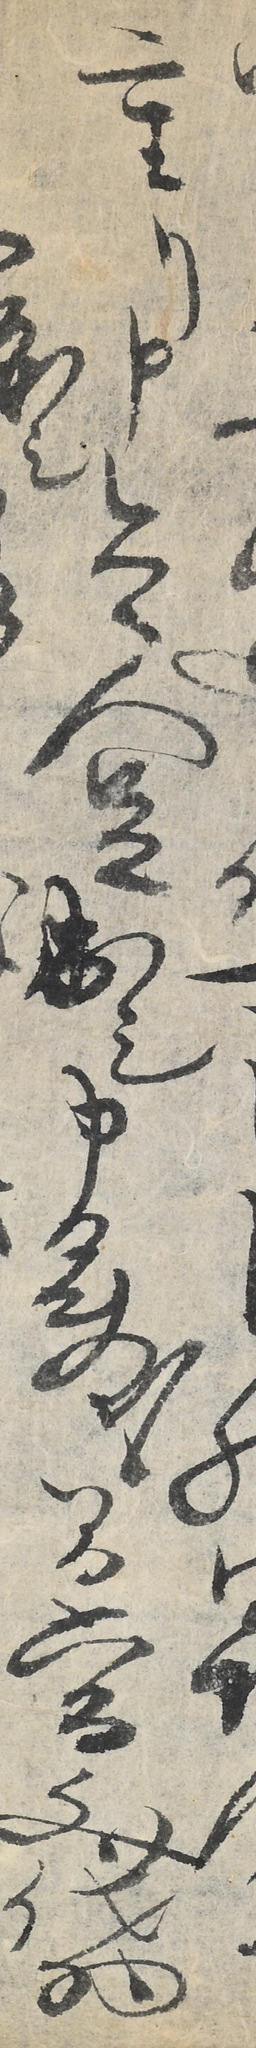重り申候ハヽ人足出シ申間敷候間六百文代物
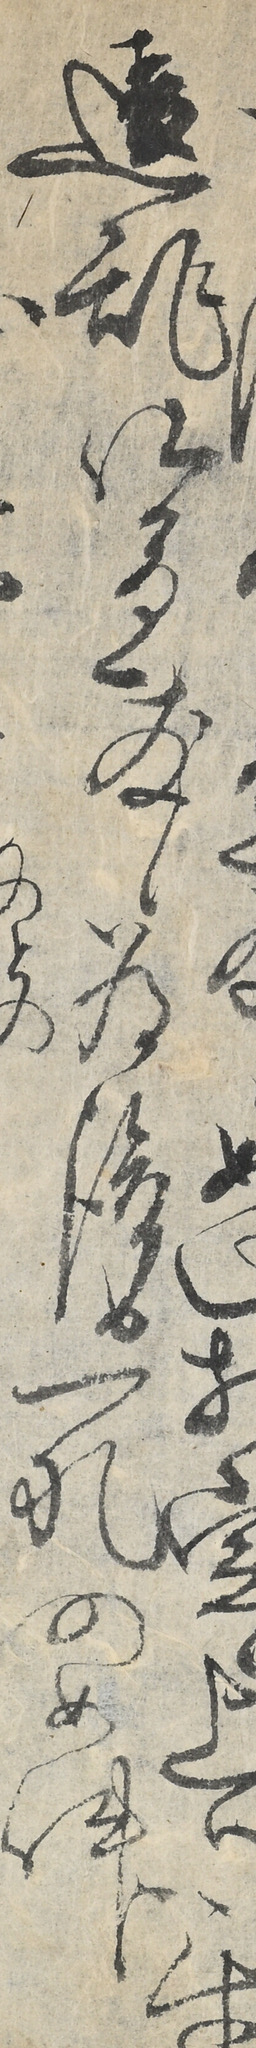違乱仕間敷候為後日一札仍如件
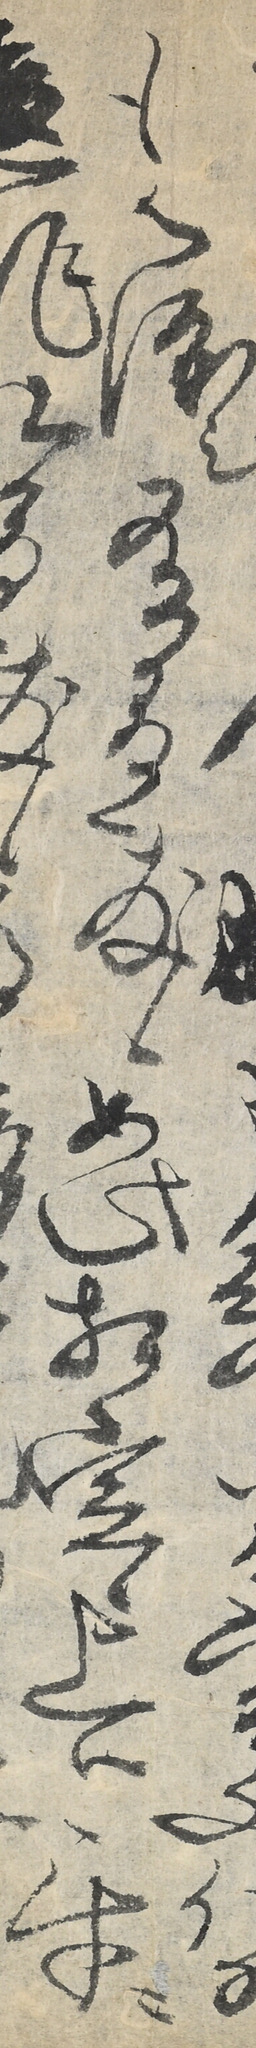も御渡シ有間敷候如此相定候上ハ互ニ
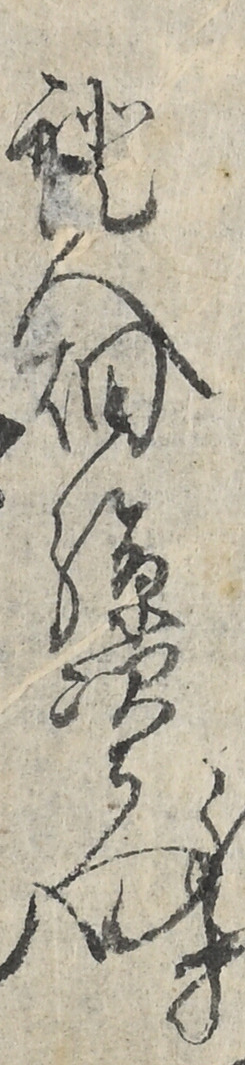証人畑孫次右衛門
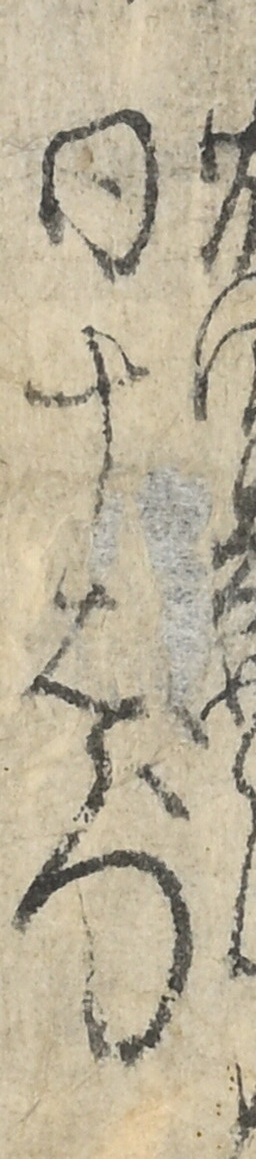同十右衛門

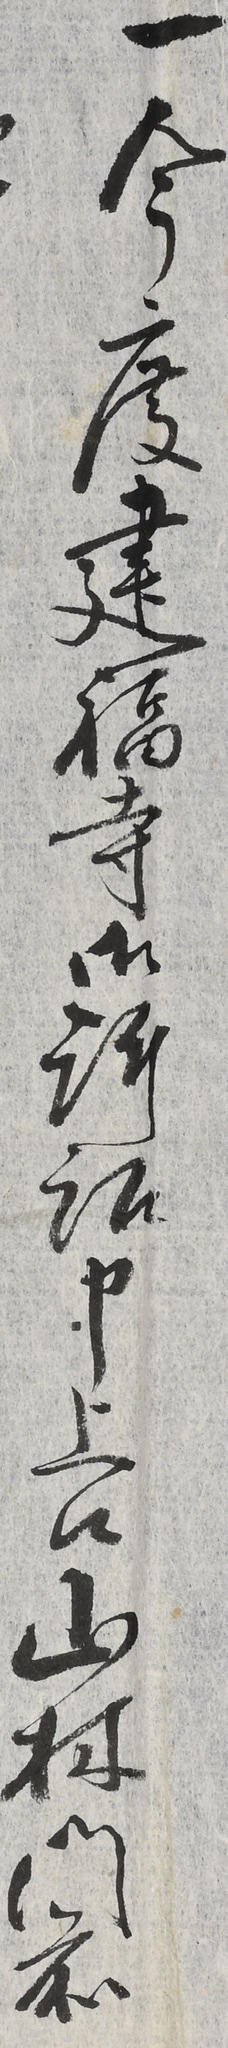一今度建福寺御訴訟申上候山林門前
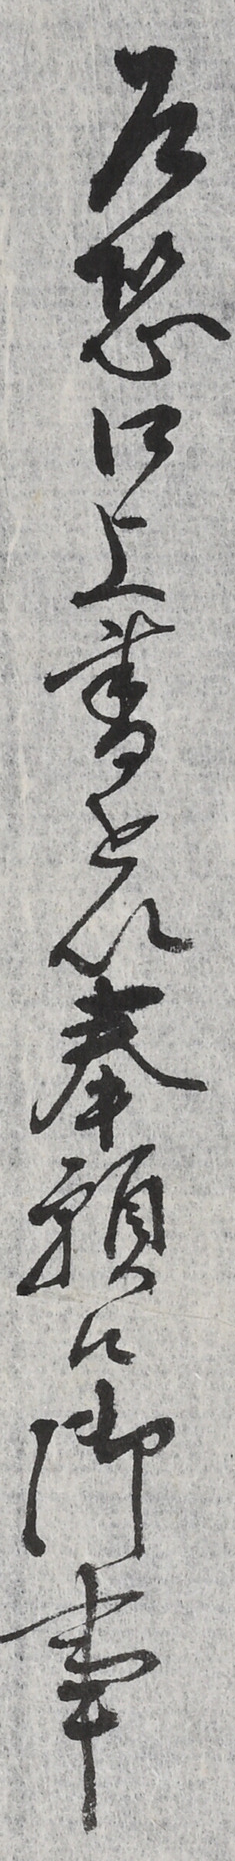乍恐口上書を以奉願候御事
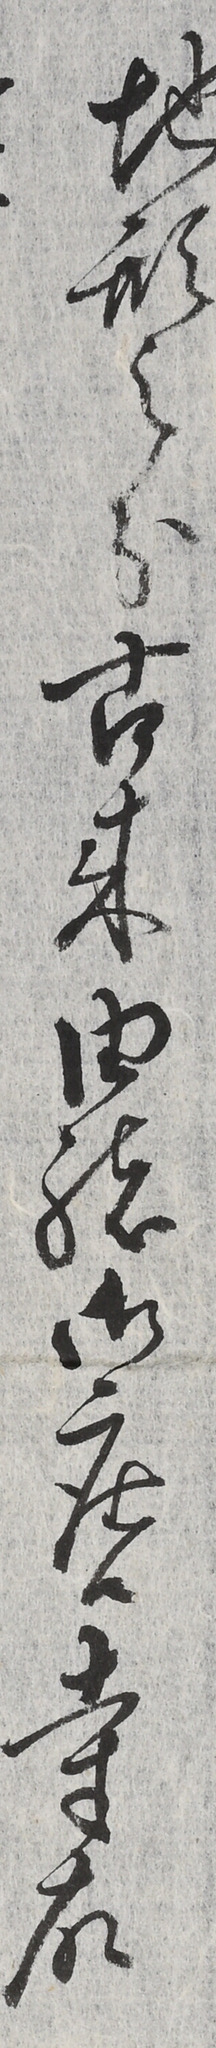地形之分古来由緒御座候寺故
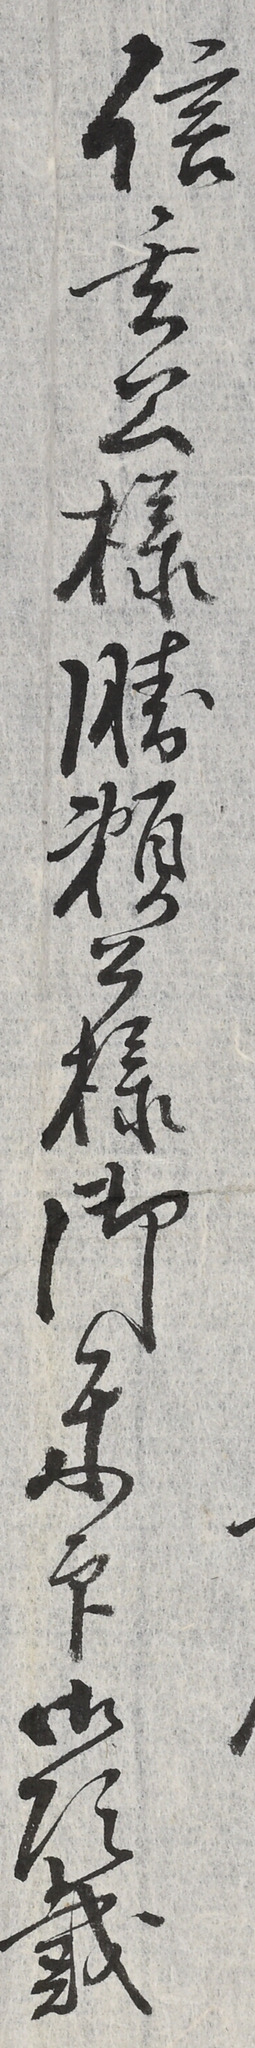信玄公様勝頼公様御朱印御頂戴
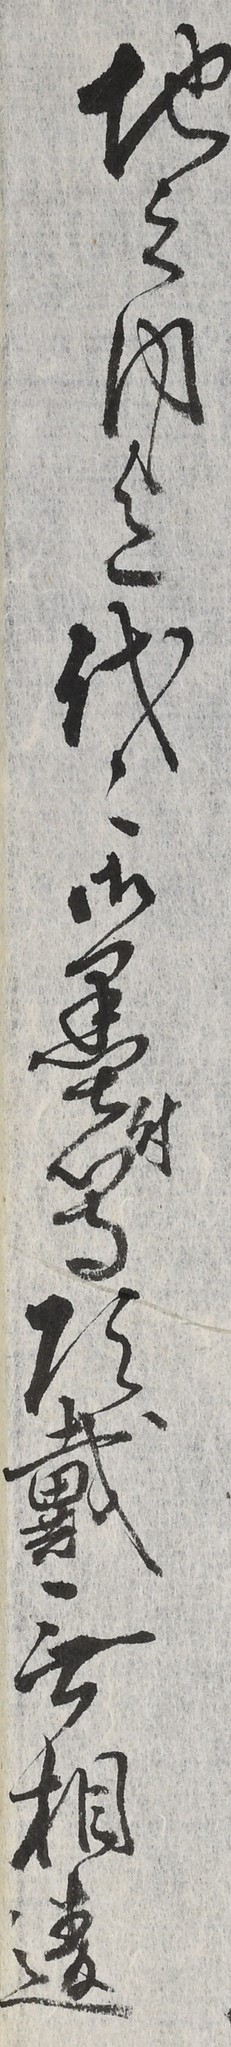地之内迄代々御墨付等頂戴無相違
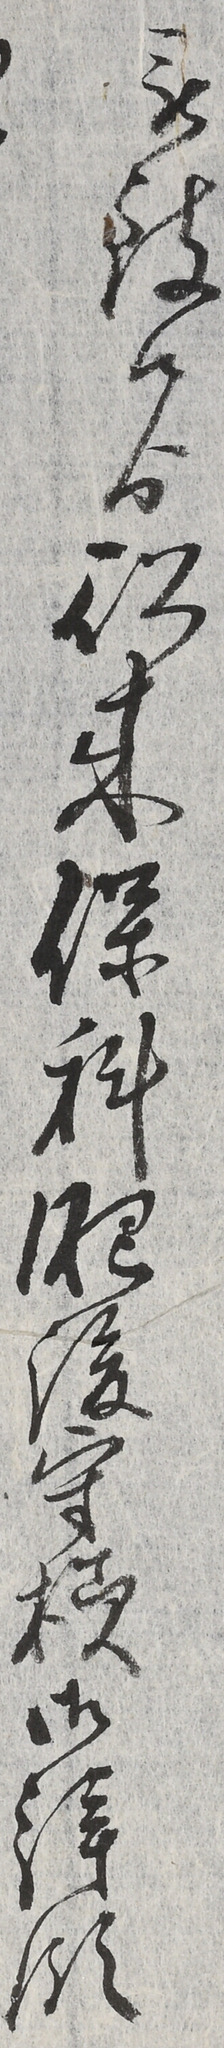被致候ゟ以来保科肥後守様御拝領
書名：旧記
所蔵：伊那市立高遠町図書館・合同会社AMANE
